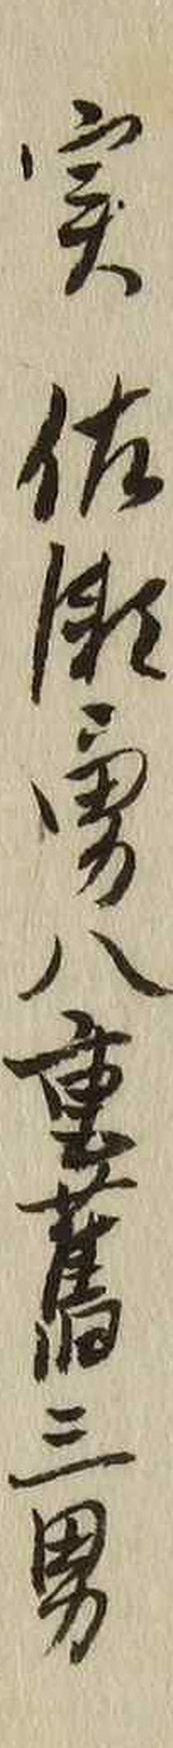実佐瀬勇八重旧三男
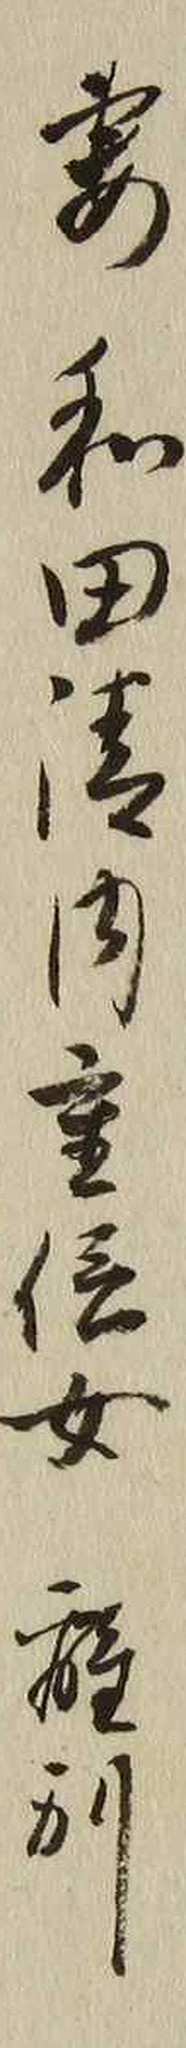妻和田清内重信女離別
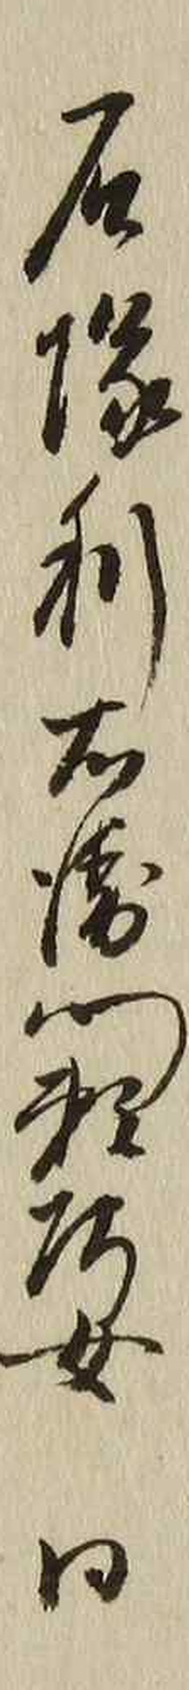石塚利右衛門頼巧女同
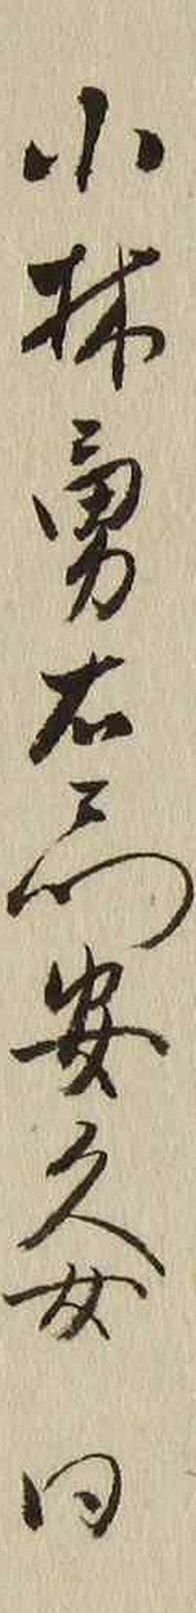小林勇右衛門安久女同
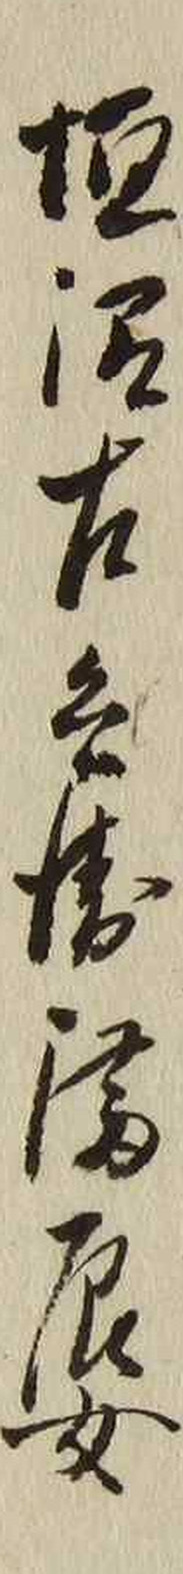垣沼古兵衛満辰女
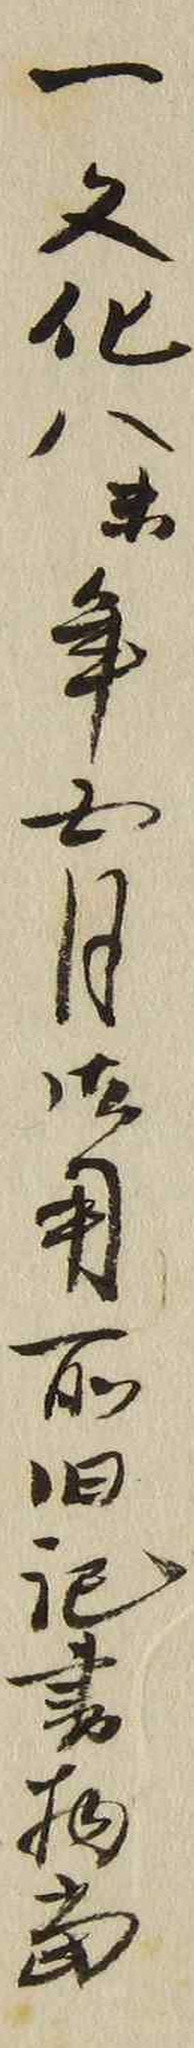一文化八未年五月御用所旧記書物当
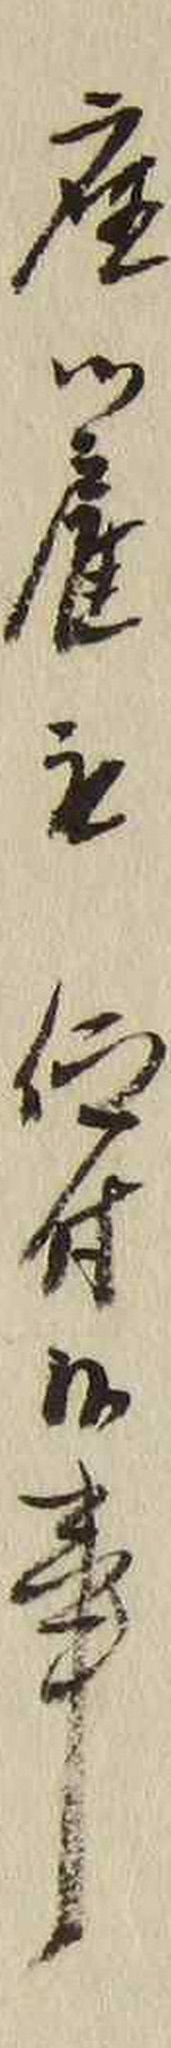座御雇被仰付候事
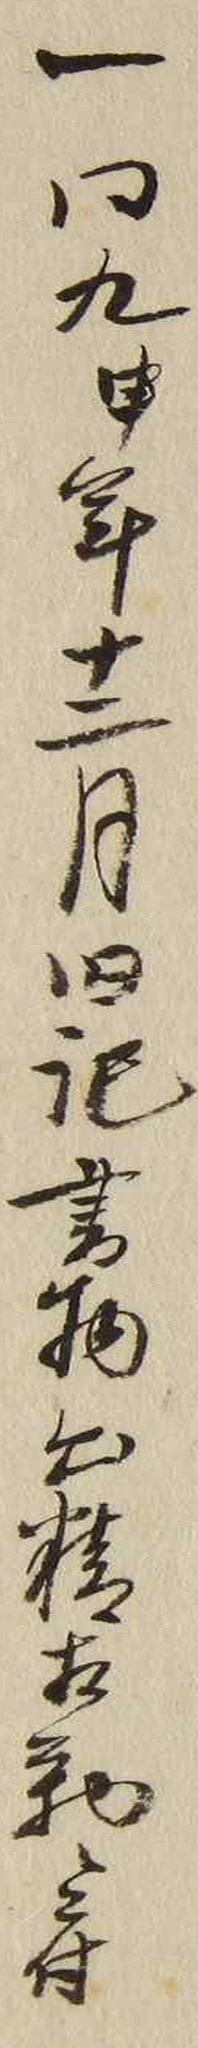一同九申年十二月旧記書物出精相勤候ニ付

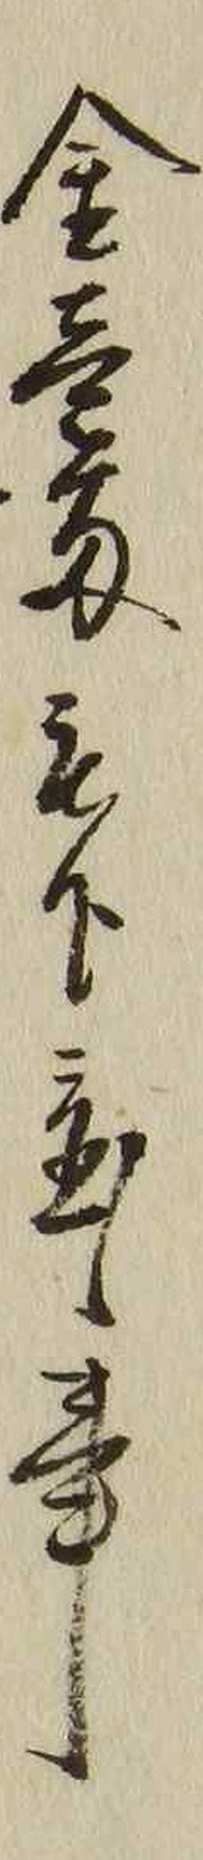金壱両被下置候事
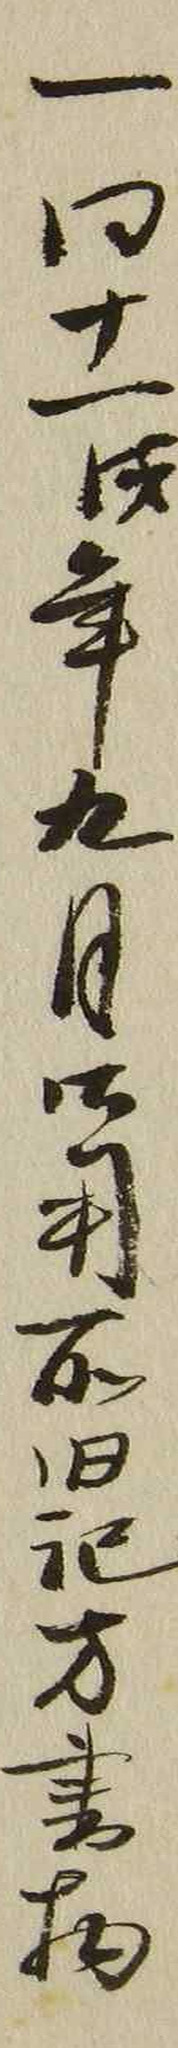一同十一戌年九月御用所旧記方書物
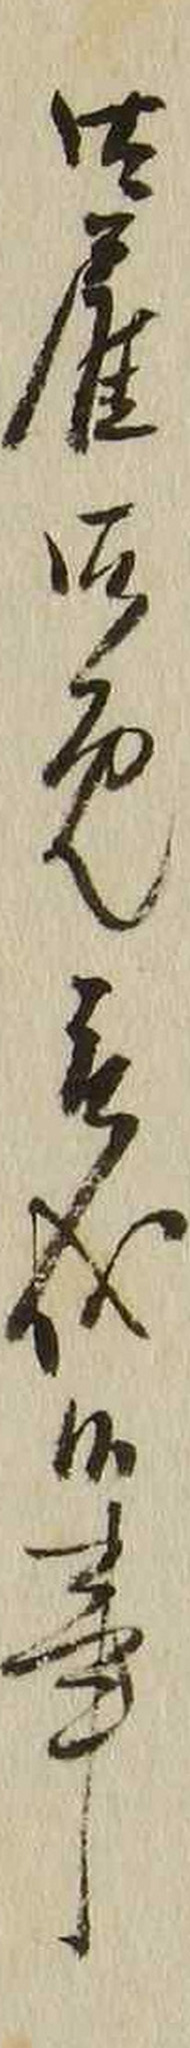御雇御免被成候事
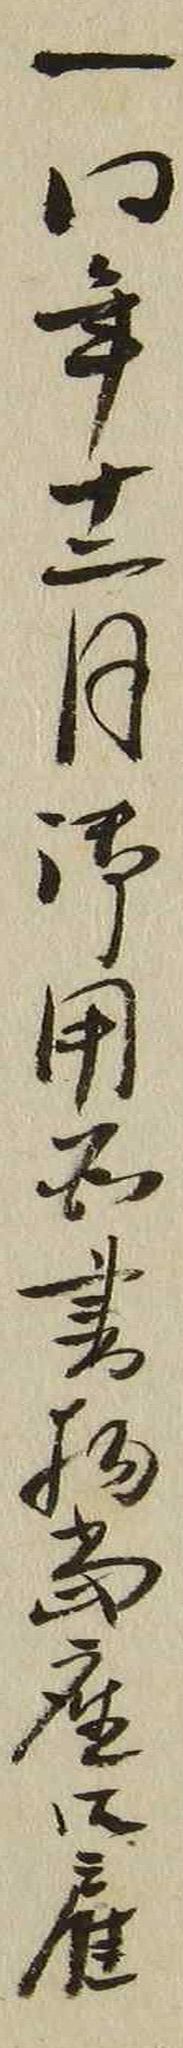一同年十二月御用所書物当座御雇
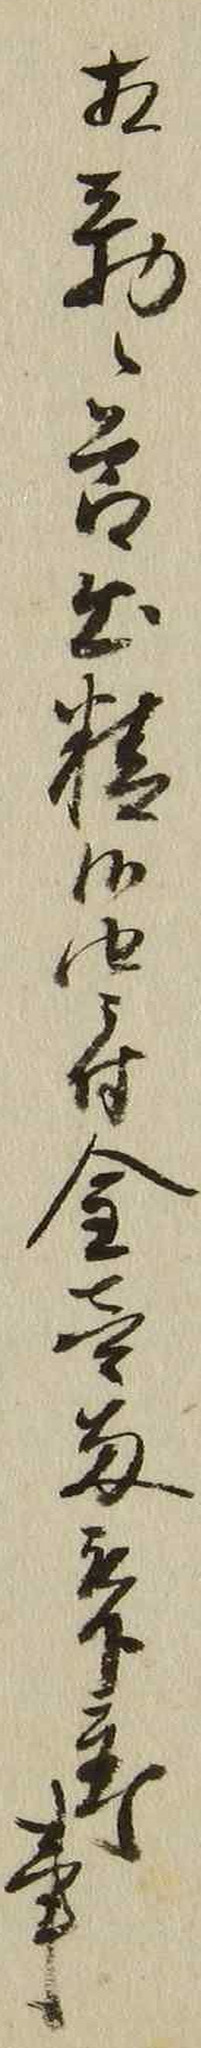相勤候節出精候由ニ付金壱両被下置候事
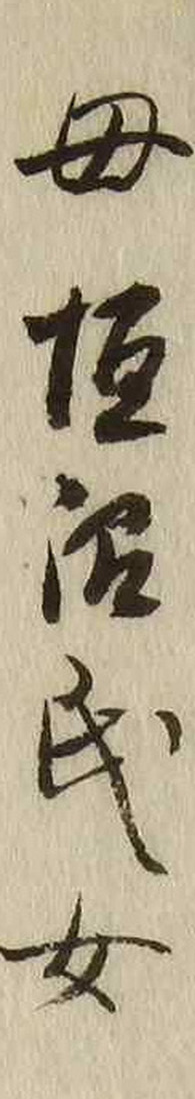母垣沼氏女
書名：諸士系譜　巻之360　す之部10
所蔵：会津若松市立会津図書館
